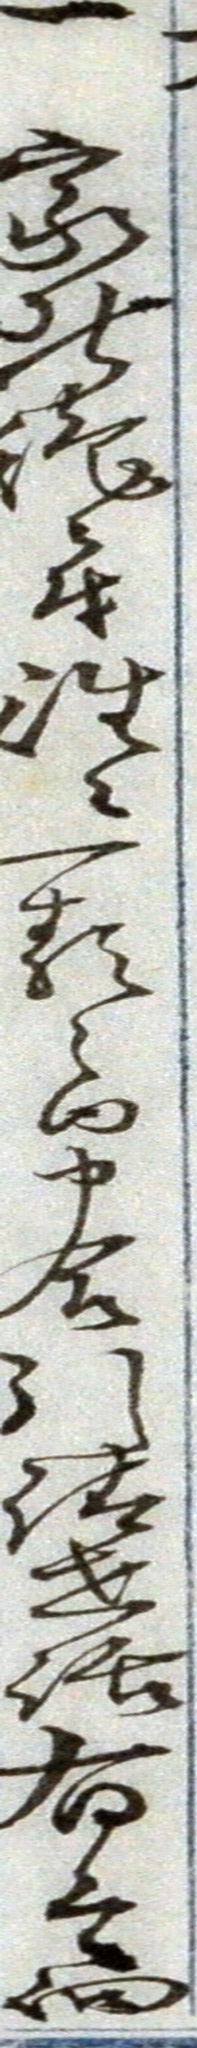一家断絶ニ付往々一類之内申合引請世話有之向
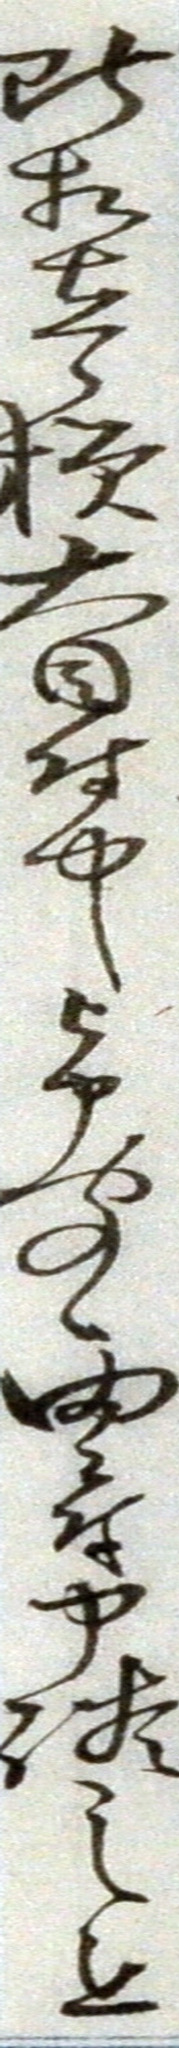断相立候様大目付中被申聞候由ニ申談之上
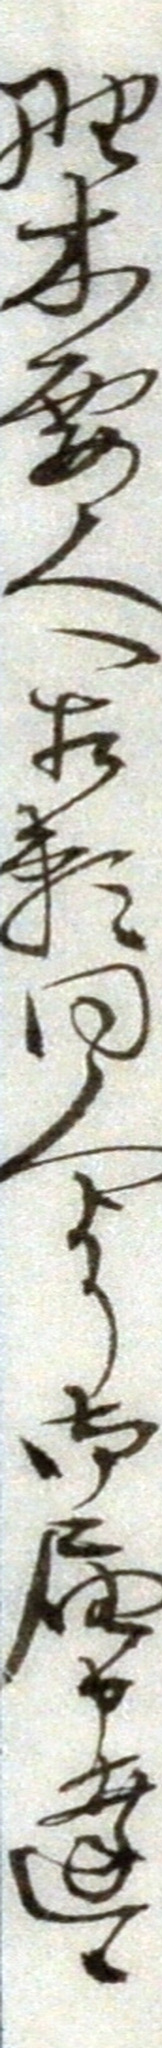野木要人へ相頼同人より御届申達候
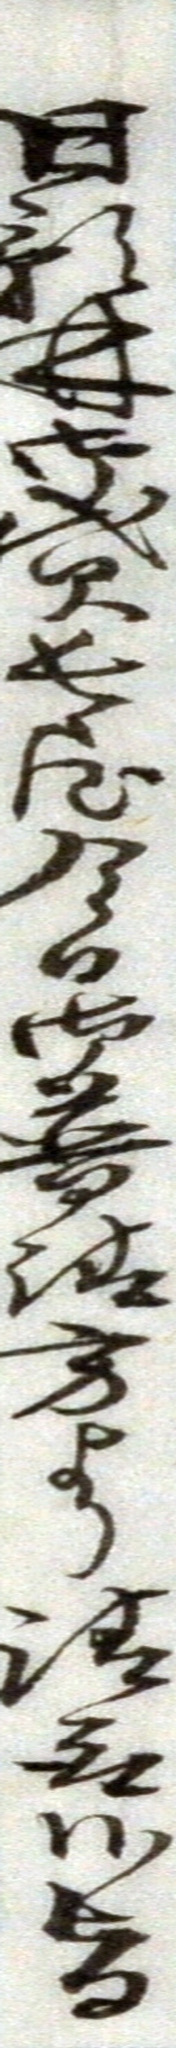一日影林御貸長屋今日御普請方より請取候旨
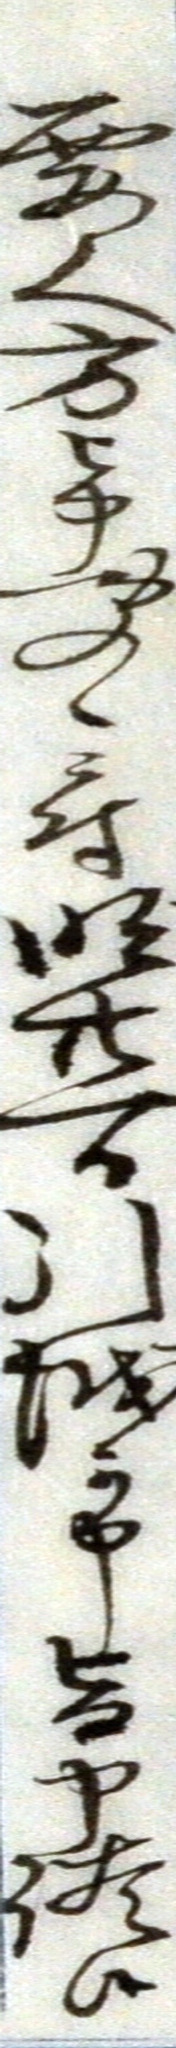要人方被申聞候ニ付明廿一日引越可申旨申談候
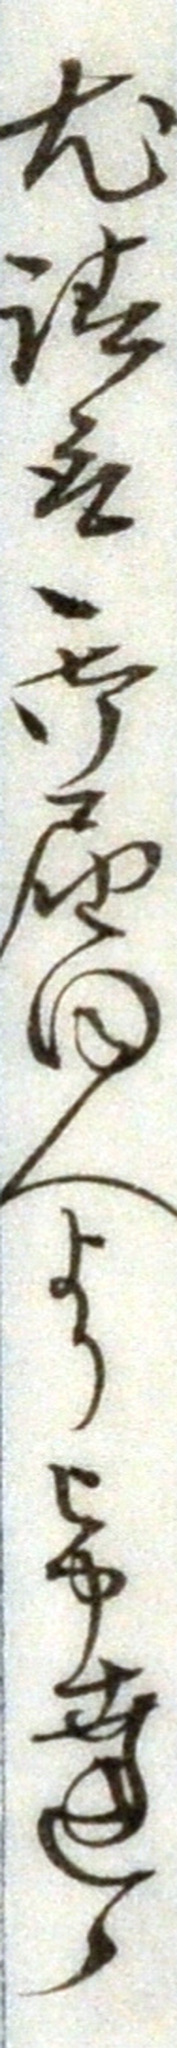尤請取候御届同人より被申達候
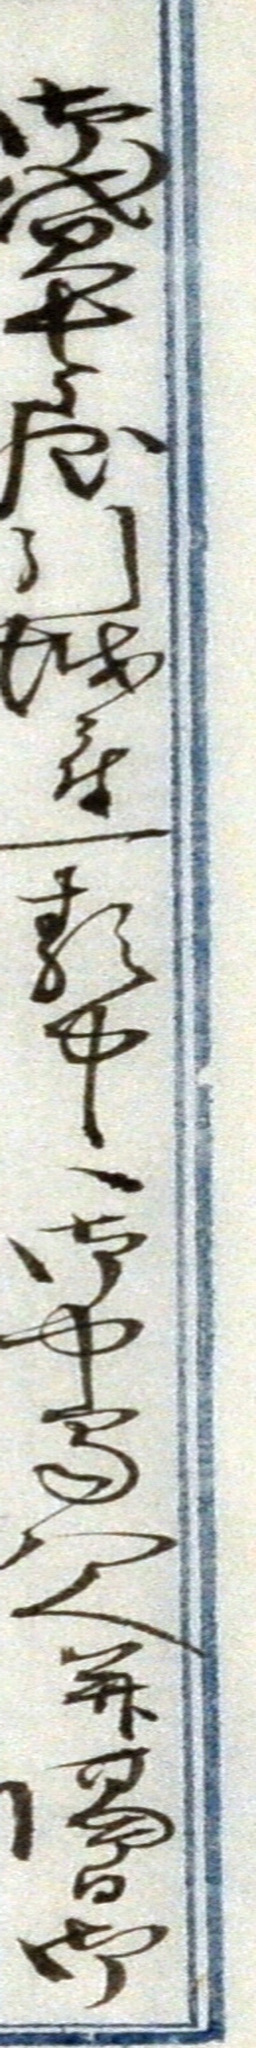一御貸長屋引越ニ付一類中へ御中間八人幷隔日御
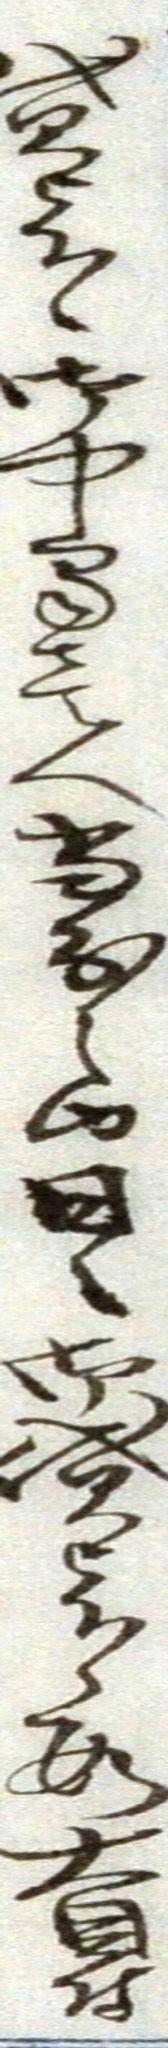貸被下候御中間壱人当分之内日々御貸被下候段大目付
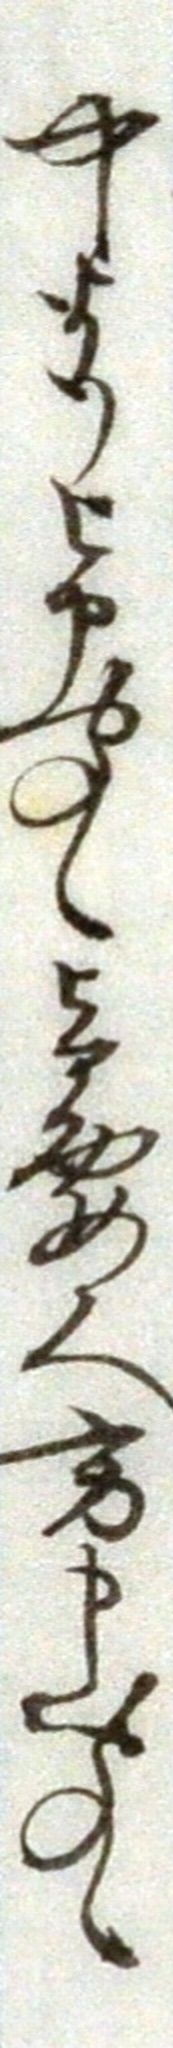中より被申聞候旨要人方申聞候
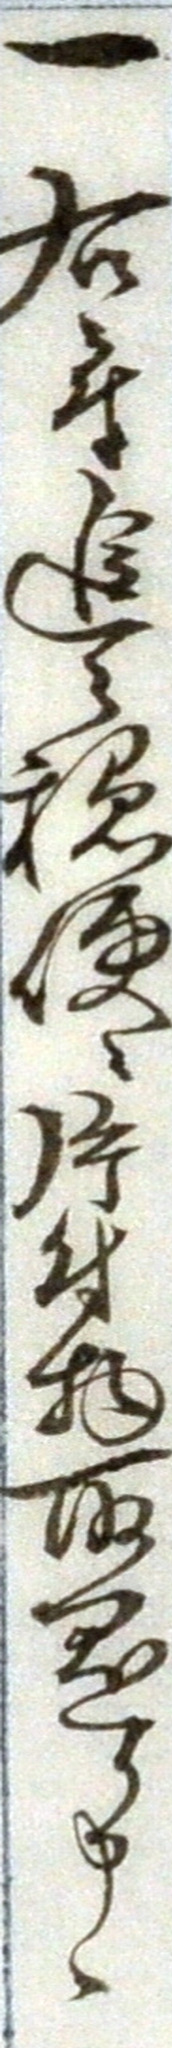一右ニ付追々穏便ニ片付物取懸り申候
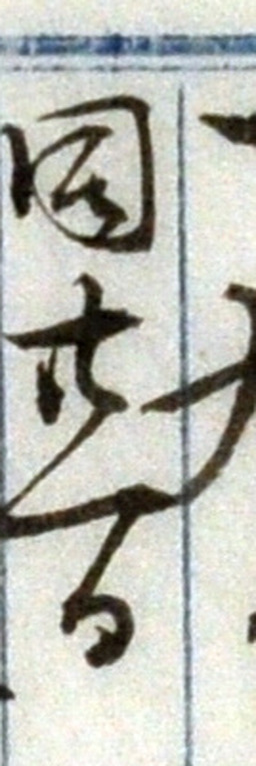同廿一日
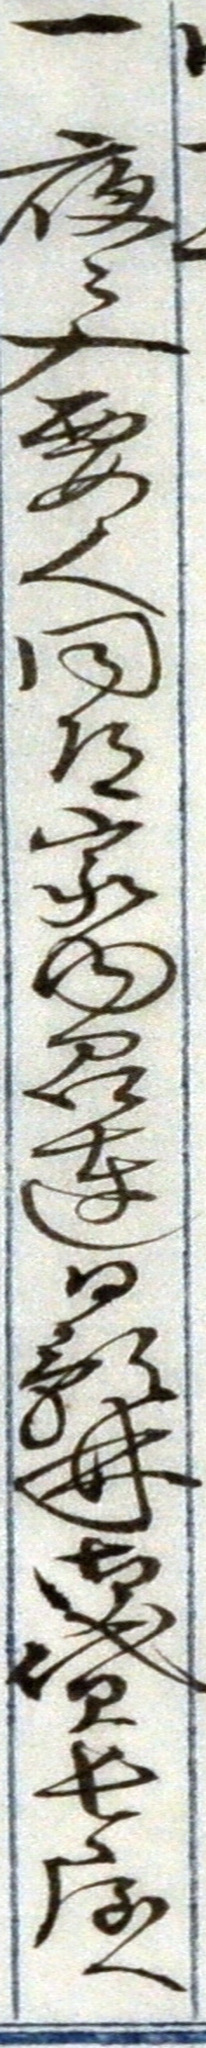一夜ニ入要人同道家内召連日影林御貸長屋へ
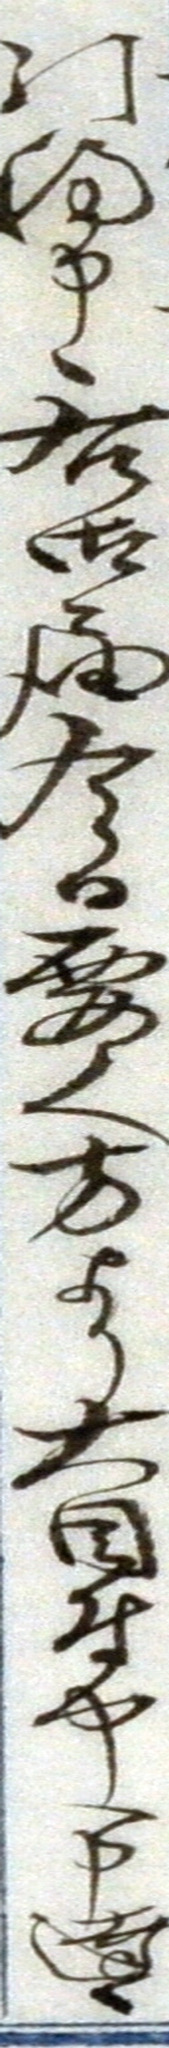引移申候右御届今日要人方より大目付中へ申達候
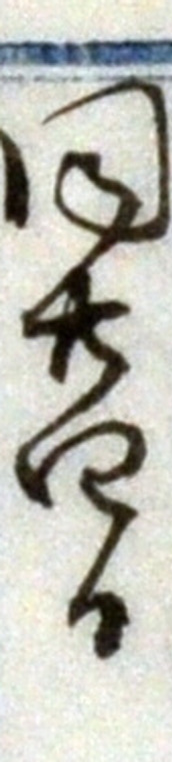同廿四日
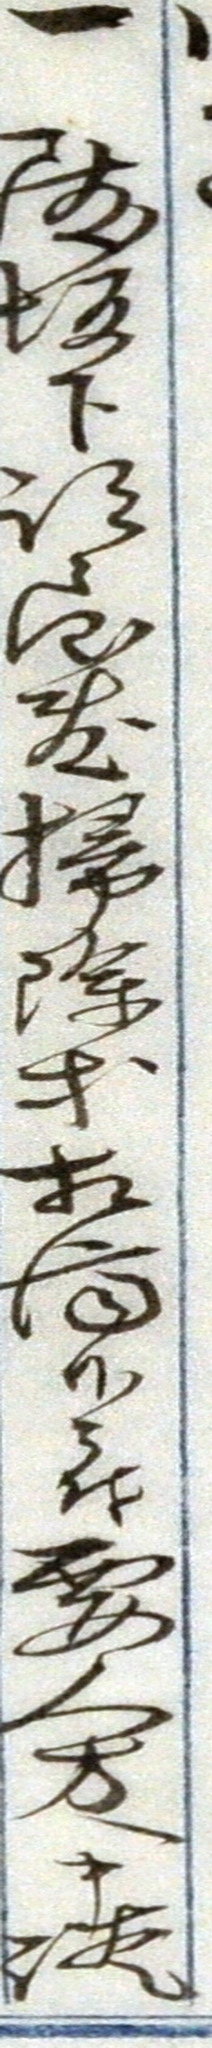一殿坂下跡屋敷掃除抔相済候ニ付要人方へ申談
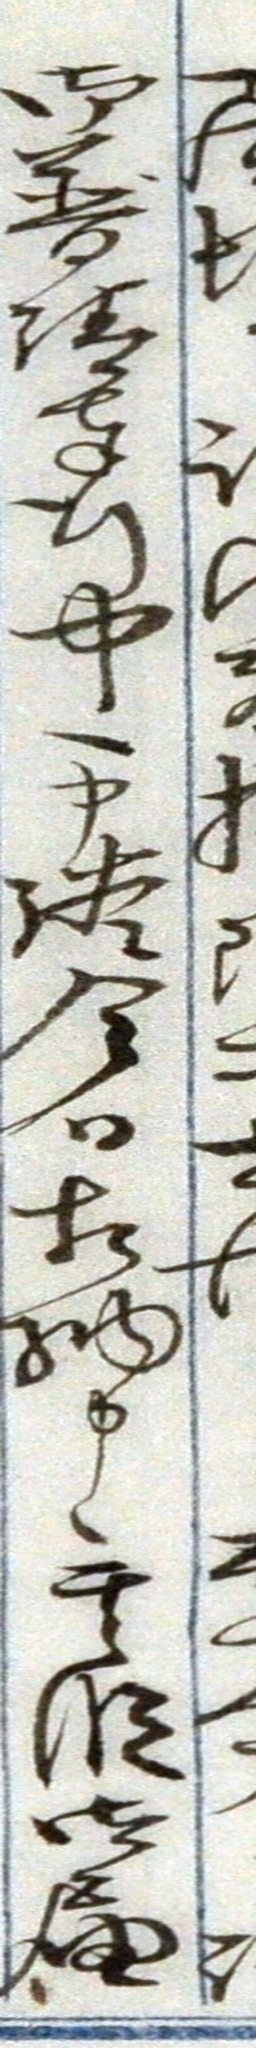御普請奉行中へ申談今日相納申候其段御届
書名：川面小藤太子細有之多賀谷唯右衛門ヲ打果候一件
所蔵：伊那市立高遠町図書館・合同会社AMANE
